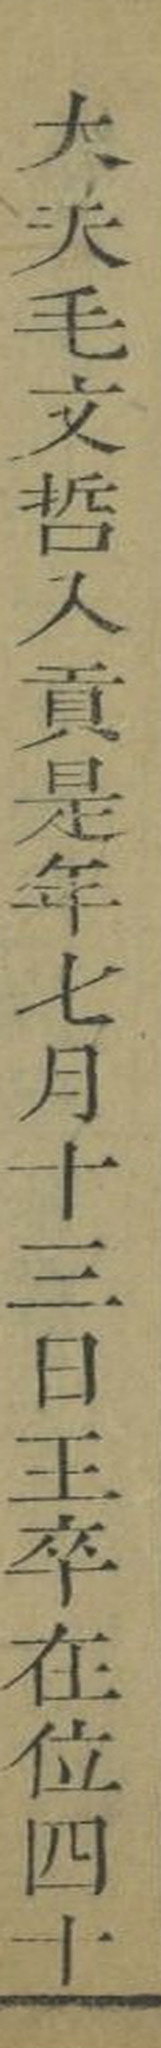大夫毛文哲入貢是年七月十三日王卒在位四十
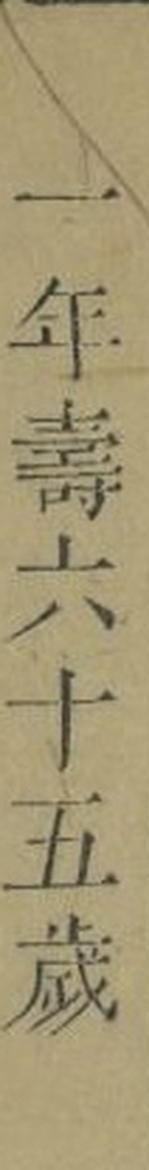一年寿六十五歳
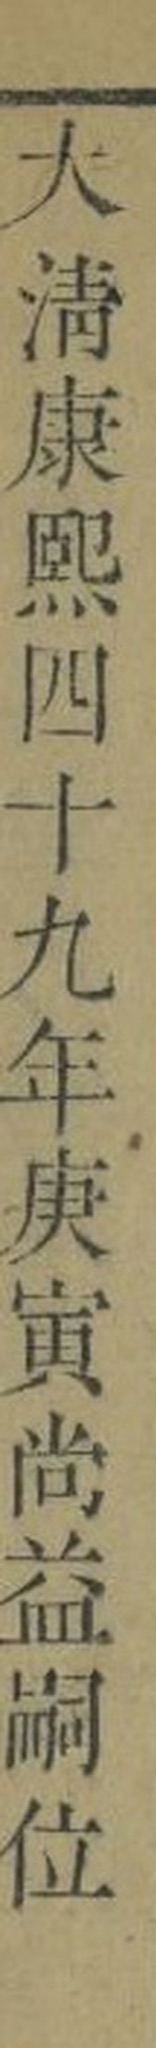大清康煕四十九年庚寅尚益嗣位
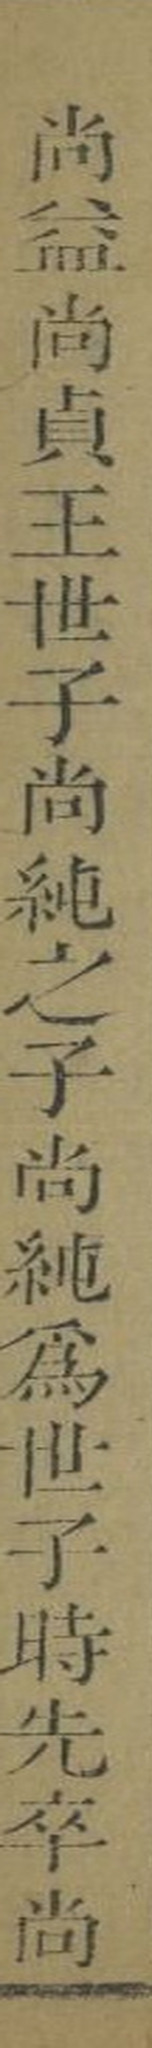尚益尚貞王世子尚純之子尚純為世子時先卒尚

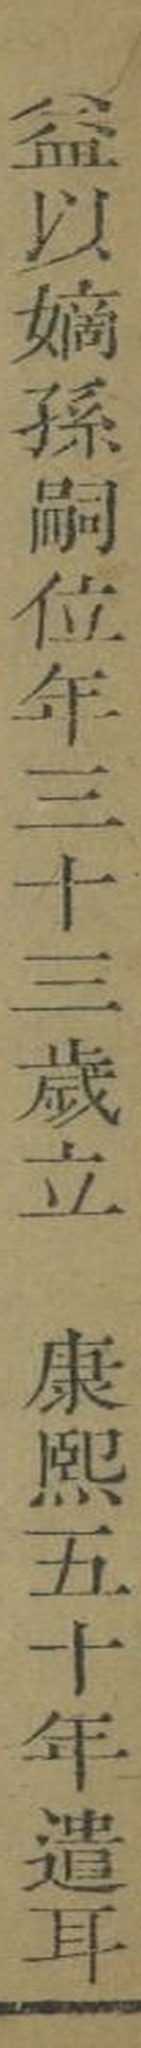益以嫡孫嗣位年三十三歳立康煕五十年遣耳
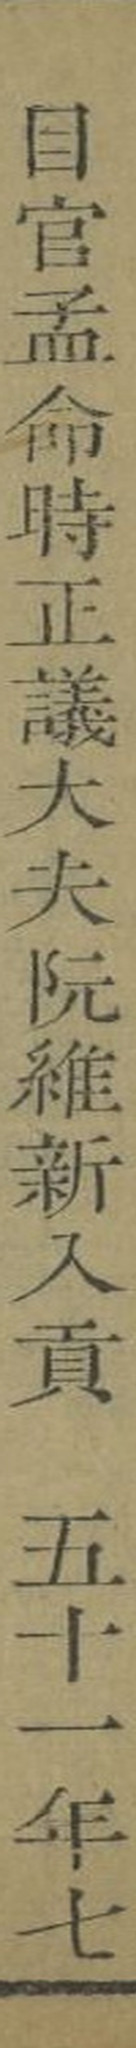目官孟命時正議大夫阮維新入貢五十一年七
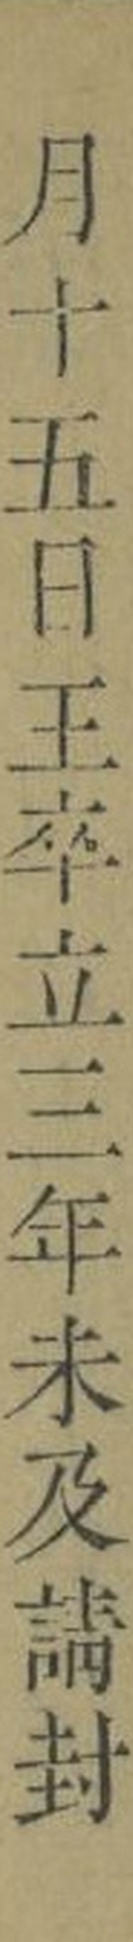月十五日王卒立三年未及請封
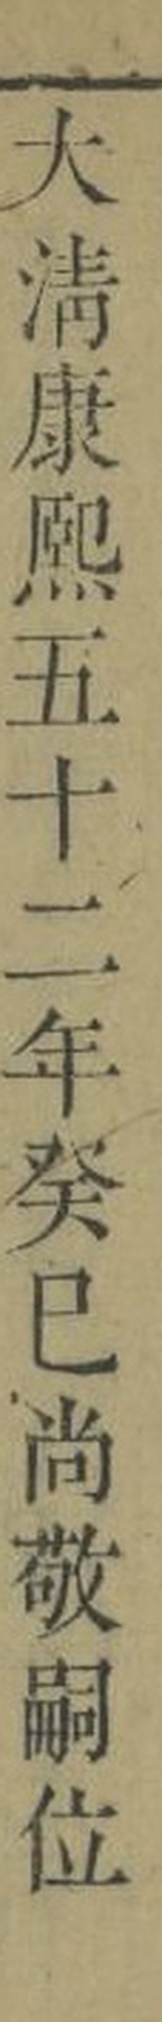大清康煕五十二年癸巳尚敬嗣位
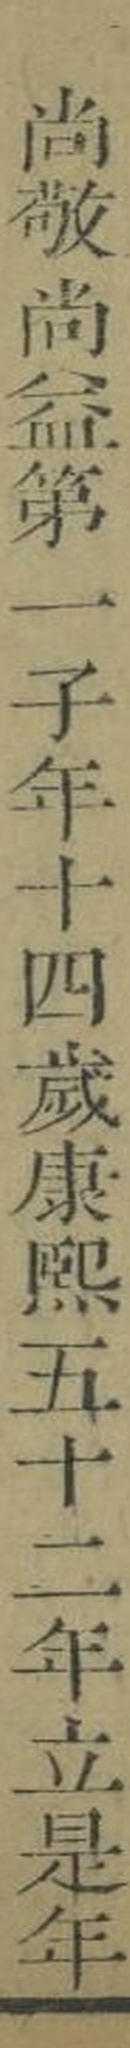尚敬尚益第一子年十四歳康煕五十二年立是年
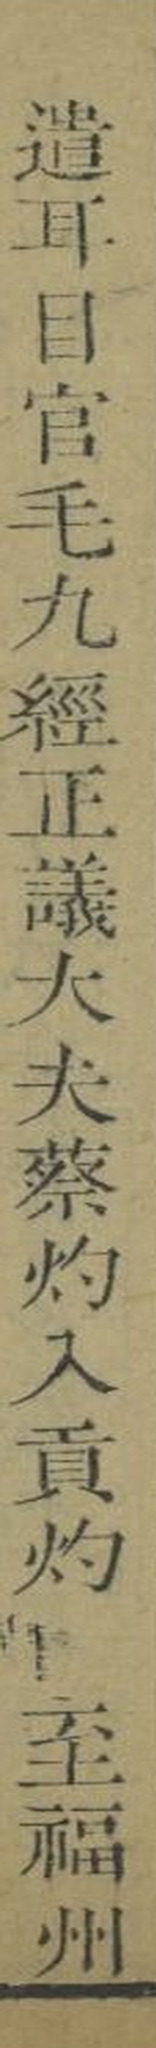遣耳目官毛九経正議大夫蔡灼入貢灼至福州
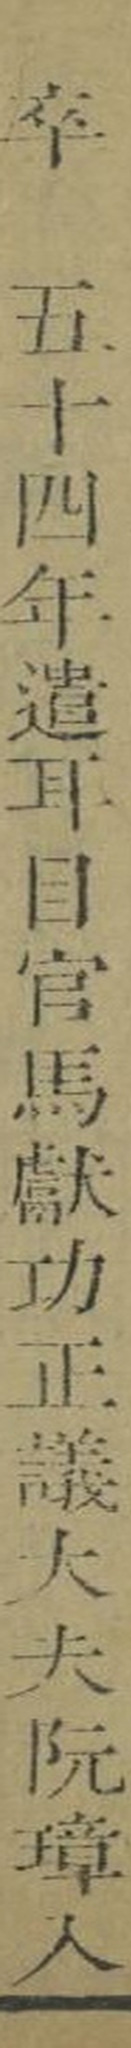卒五十四年遣耳目官馬献功正議大夫阮璋入
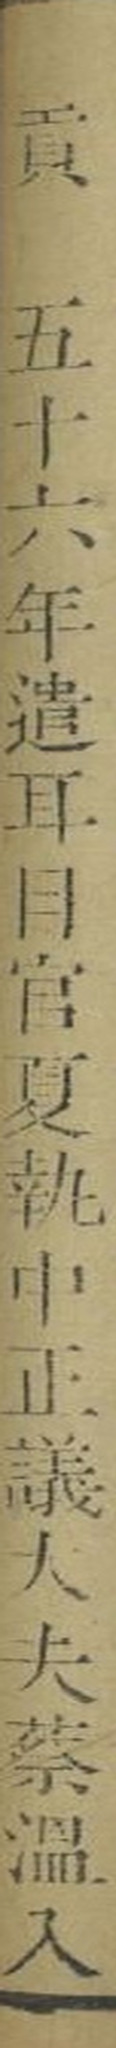貢五十六年遣耳目官夏執中正議大夫蔡温入
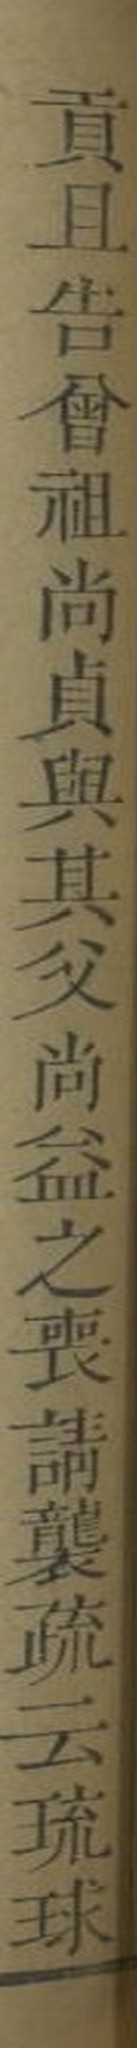貢且告曽祖尚貞与其父尚益之喪請襲疏云琉球
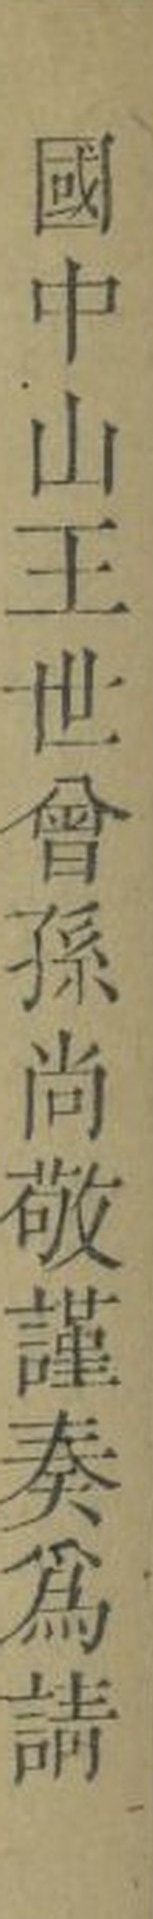国中山王世曽孫尚敬謹奏為請
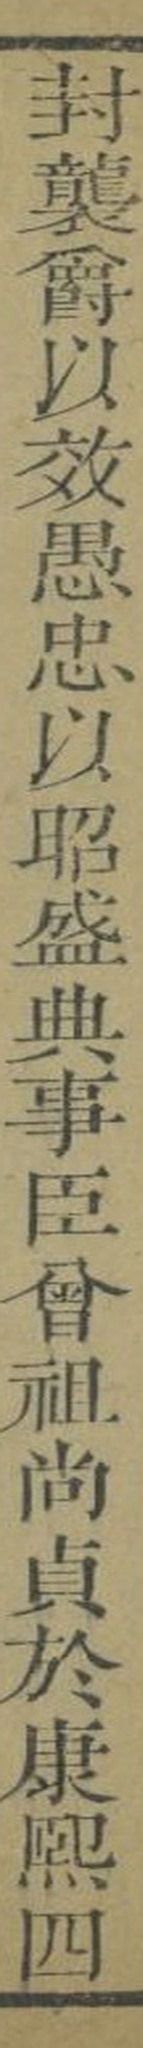封襲爵以効愚忠以昭盛典事臣曽祖尚貞於康煕四
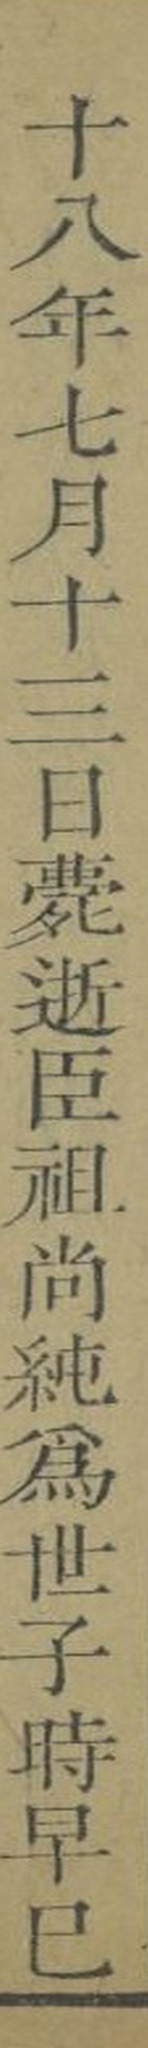十八年七月十三日薨逝臣祖尚純為世子時早巳
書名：中山伝信録 巻四
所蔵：University of the Ryukyus Library
